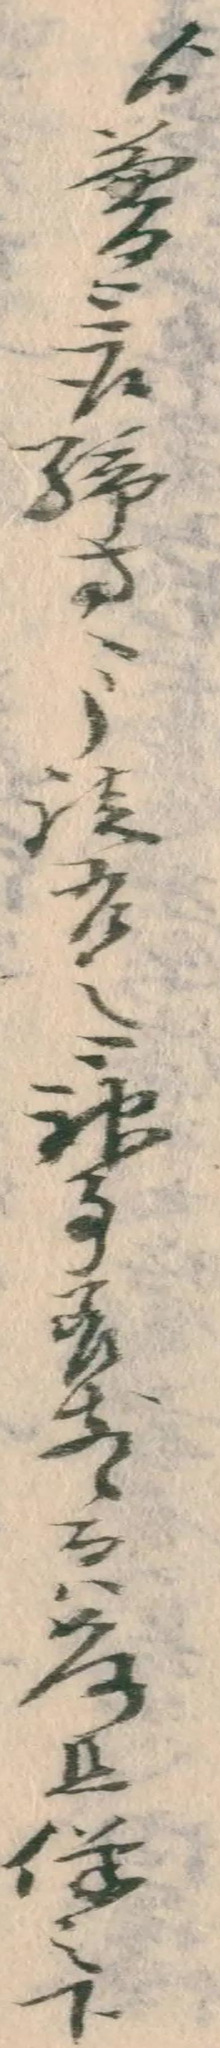ゟ兼日御取締方へ申談有之御神事差支候而は如何且従之下
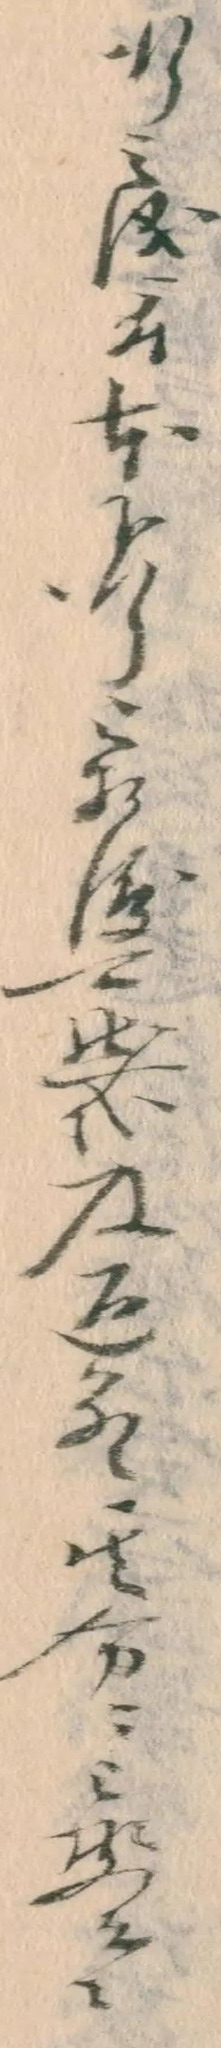行之儀ニ付本下下行被相渡可然哉及返答其分ニ被決云々
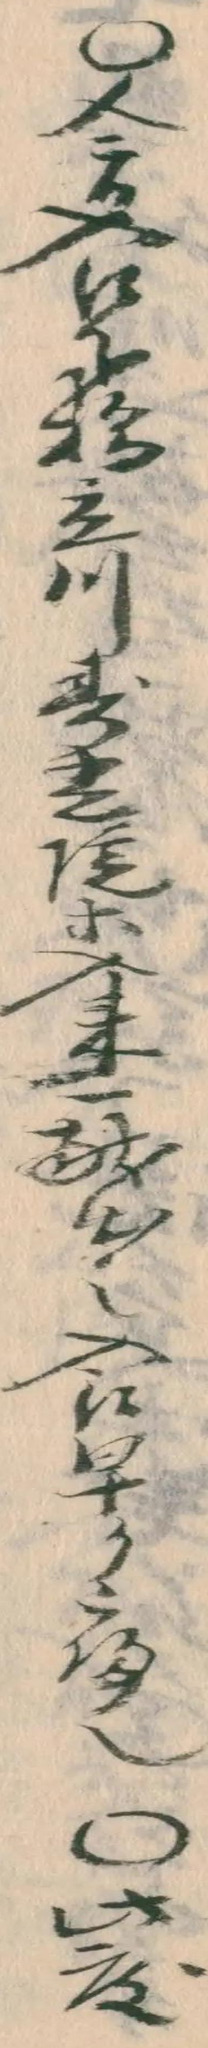○今日入江下橋立川す壽光院等入来一献出之入候早ク御帰也○此度
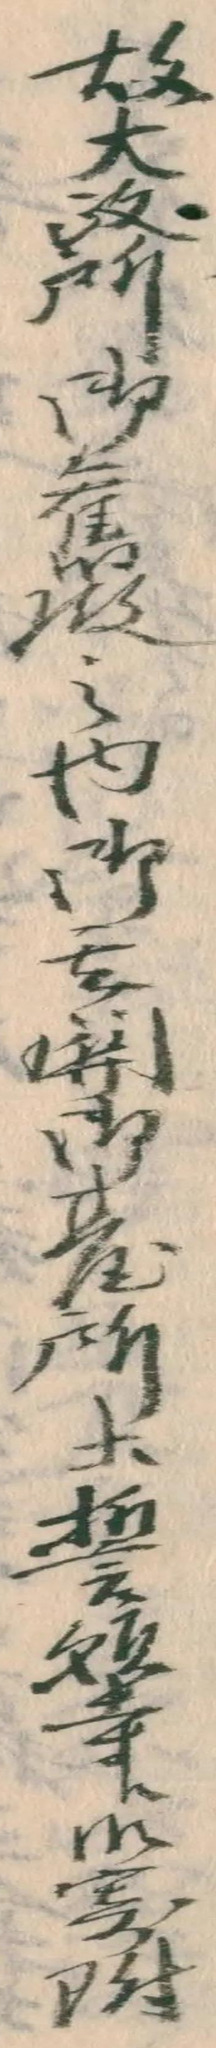故大政所御舊殿之内御玄関御臺所等誓願寺江御寄附
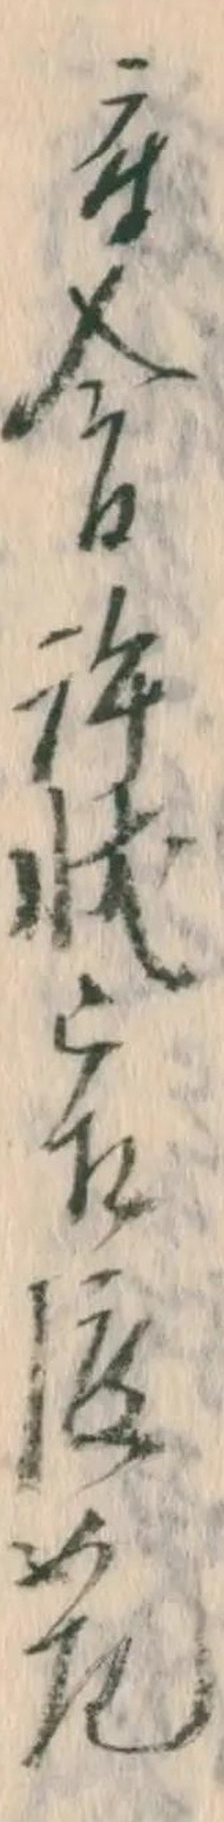ニ付今日許状被相渡如左
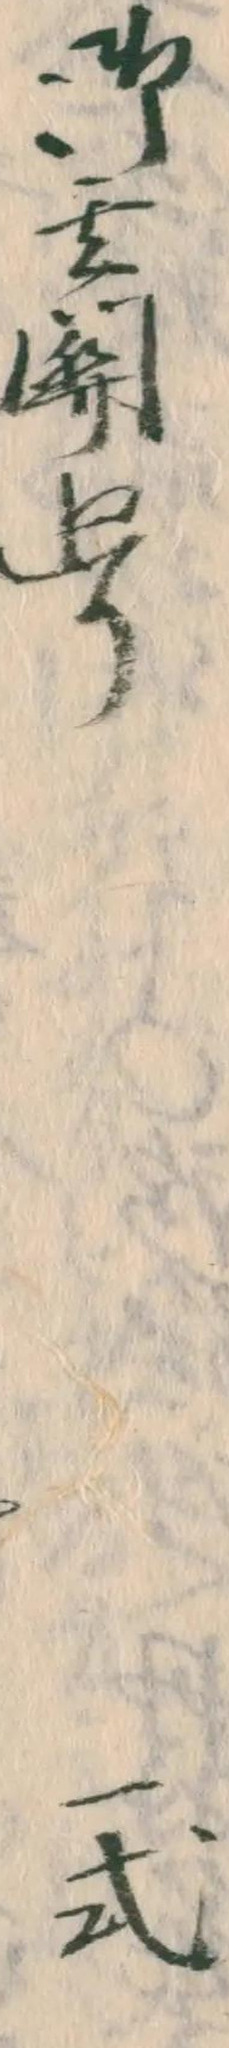御玄関廻り一式
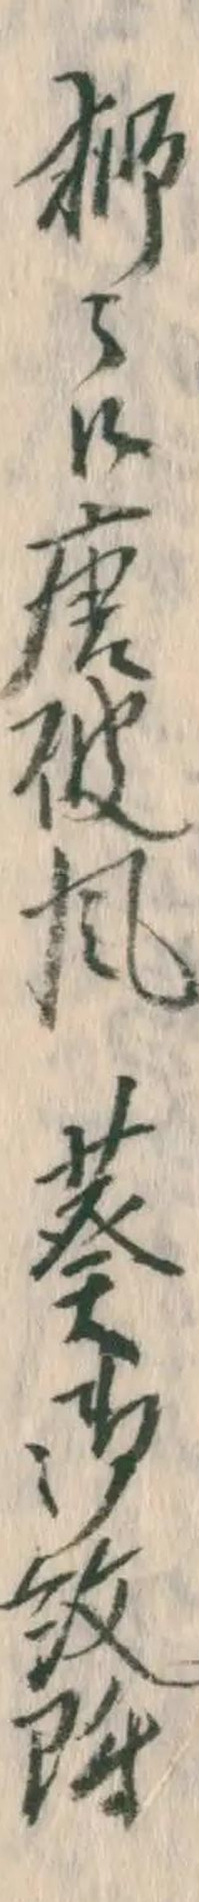獅々口唐破風葵御紋附
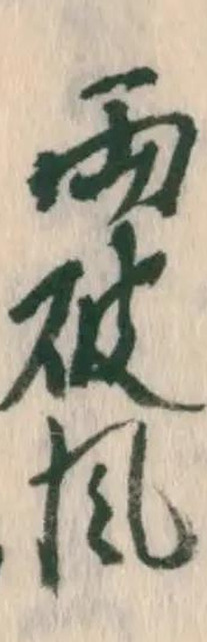両破風
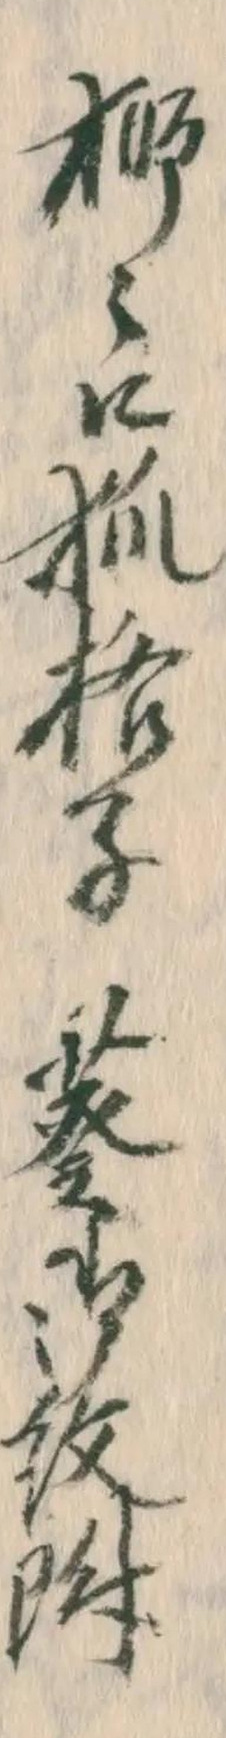獅々口狐格子葵御紋附
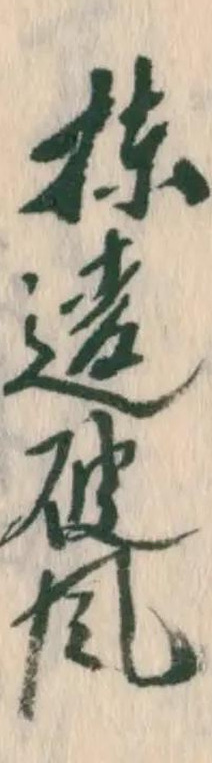棟違破風
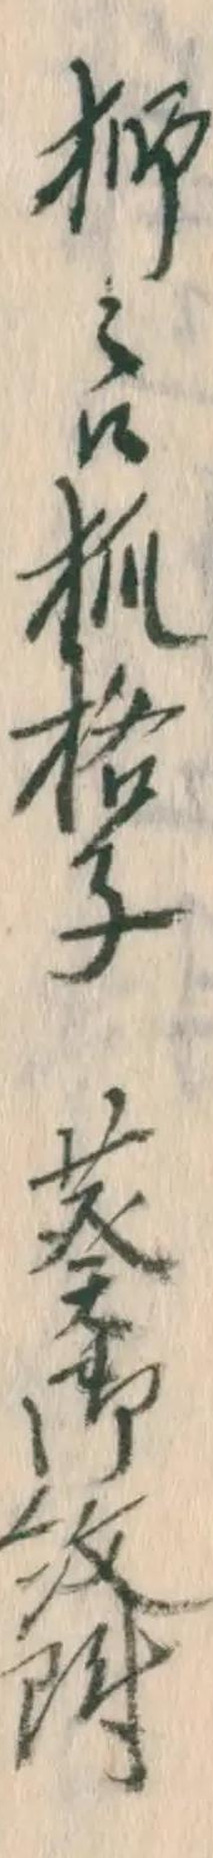獅々口狐格子葵御紋附
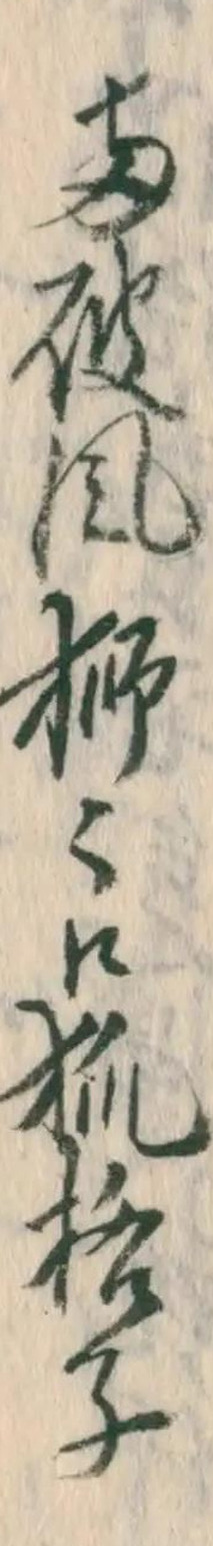両破風獅々口狐格子
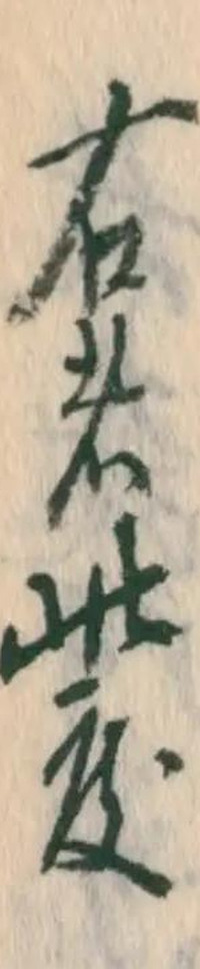右は此度

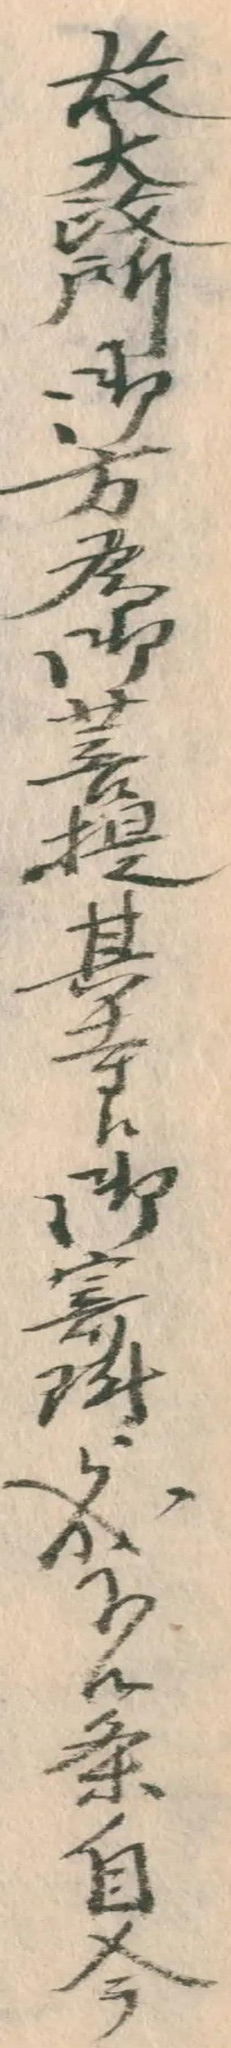故大政所御方為御菩提其寺え御寄附被成下候条自今
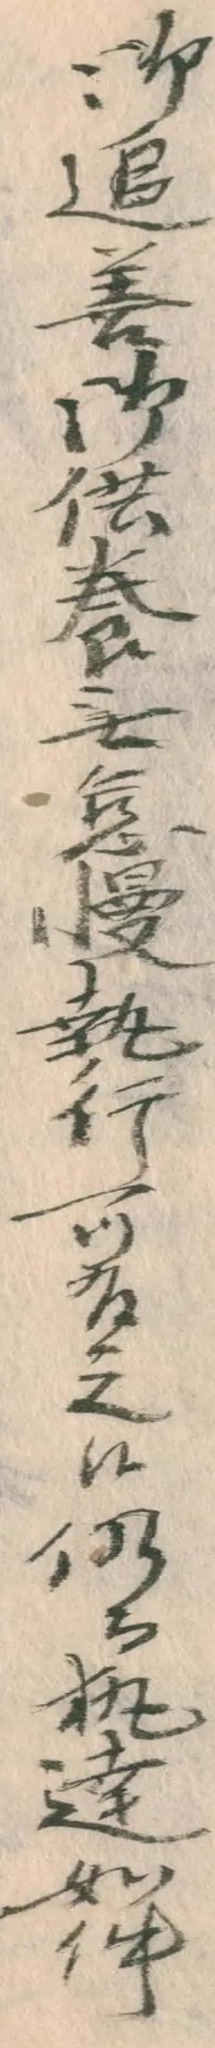御追善御供養無怠慢執行可有之候仍而執達如件
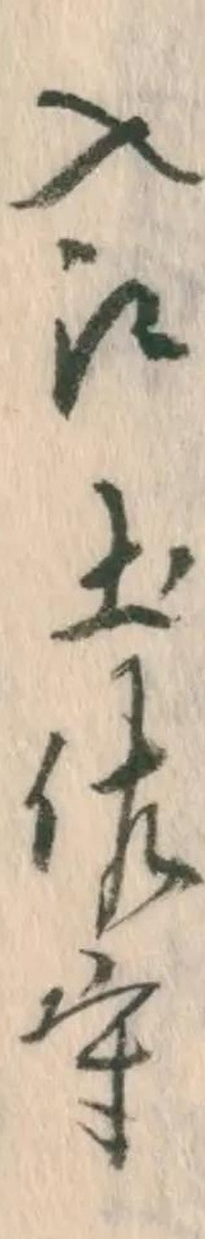入江土佐守
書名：賀茂社記録. 第70冊
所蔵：国立国会図書館 National Diet Library, JAPAN
